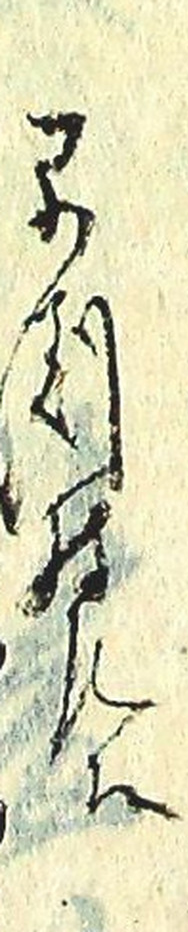早淵村庄屋
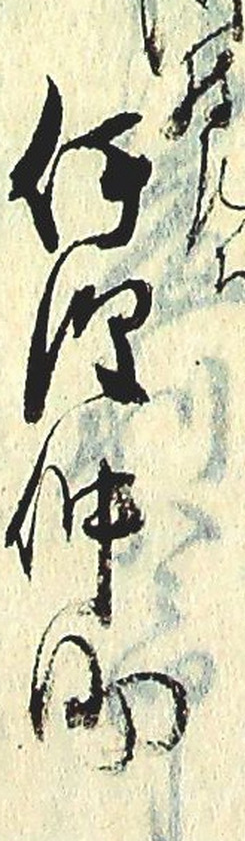伊沢仲助
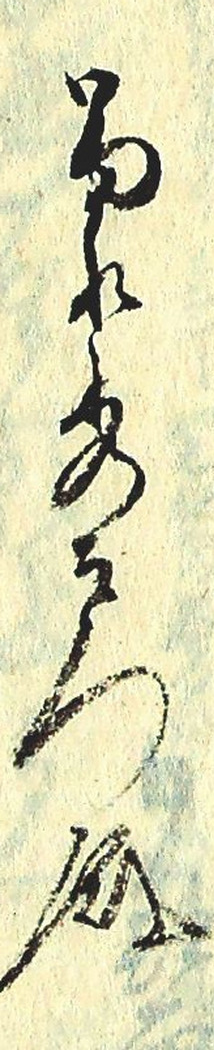富永秀左衛門殿

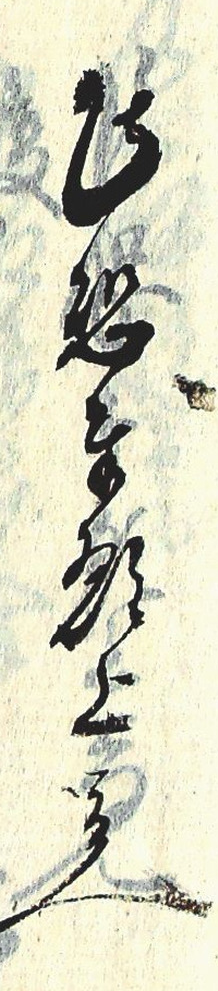乍恐奉願上覚
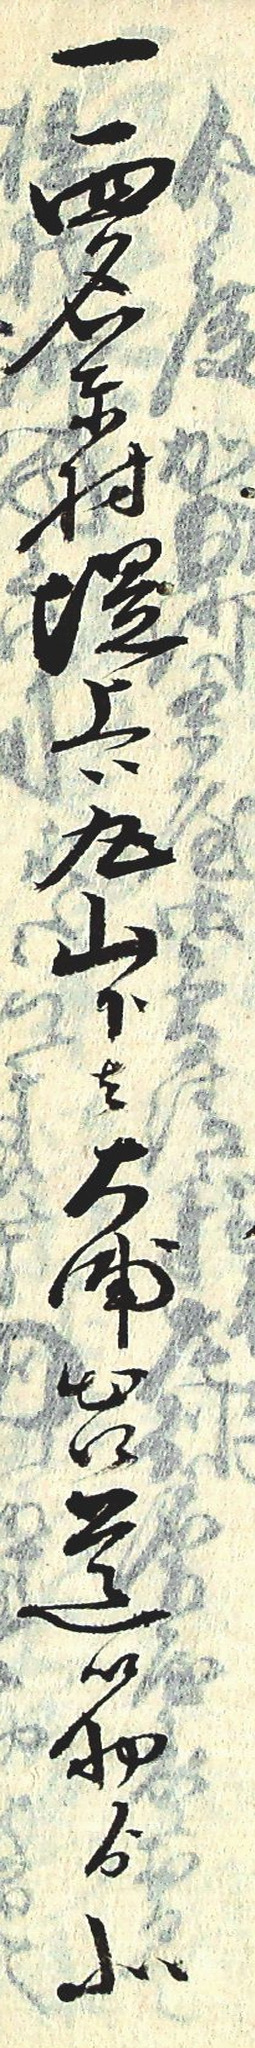一西名東村堤上は丸山下は大浦出口道筋ゟ北
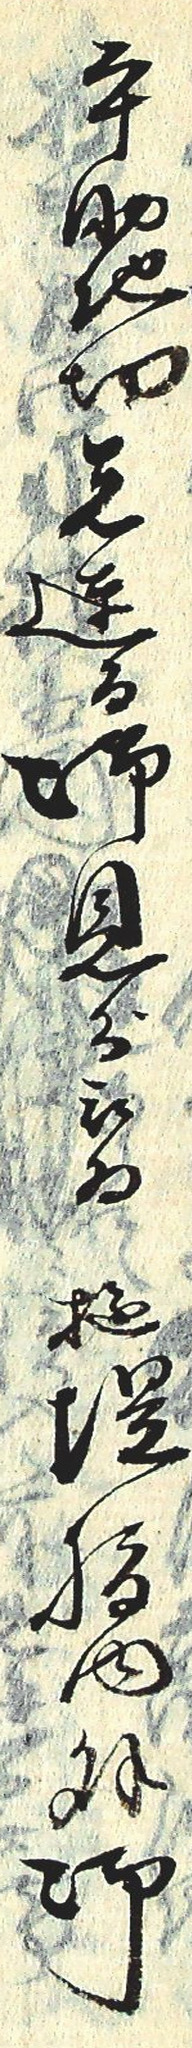平助池切先達て御見分被為遊堤腹内外御
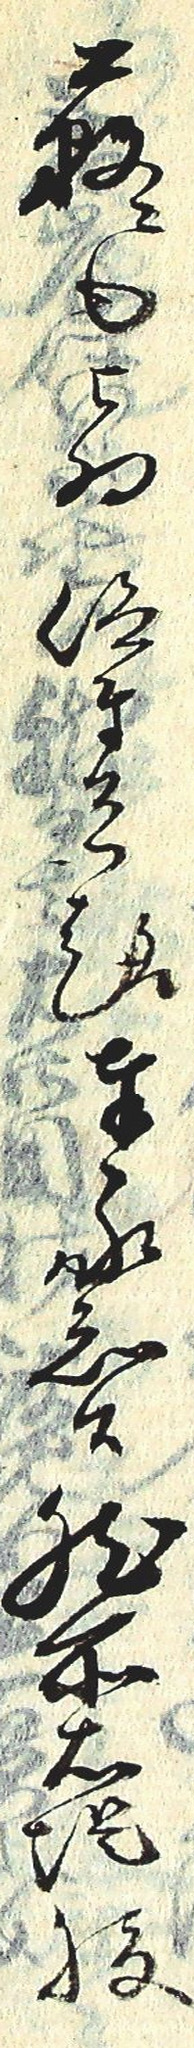藪にも被為仰付候御趣奉承知候然所右堤腹
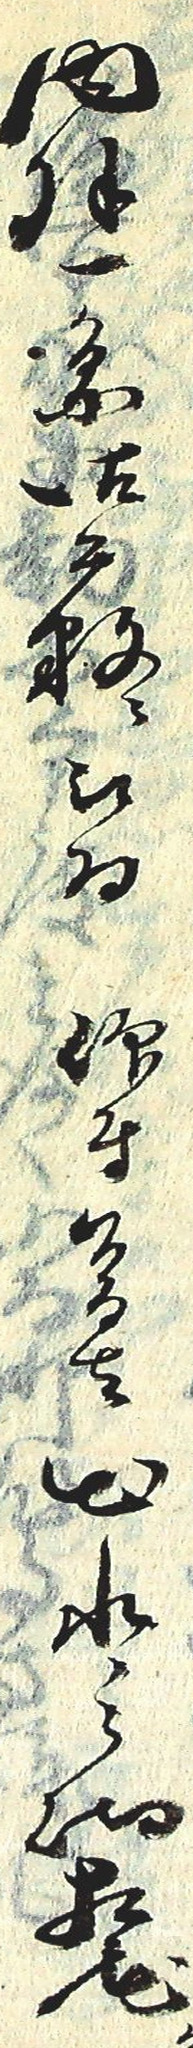内外一円御藪に被為仰付候ては出水之砌相屈く
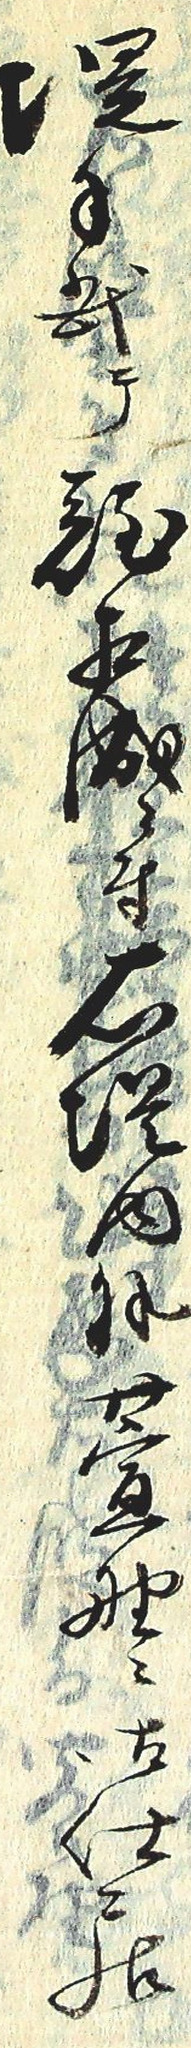堤手当て難相成に付右堤内外菅野に御仕居
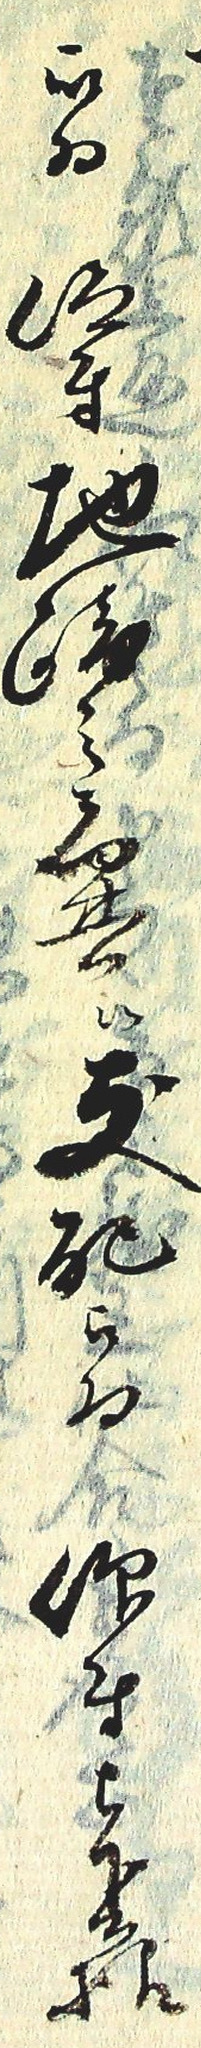被為仰付地崎之者共え支配被為仰付被下候様
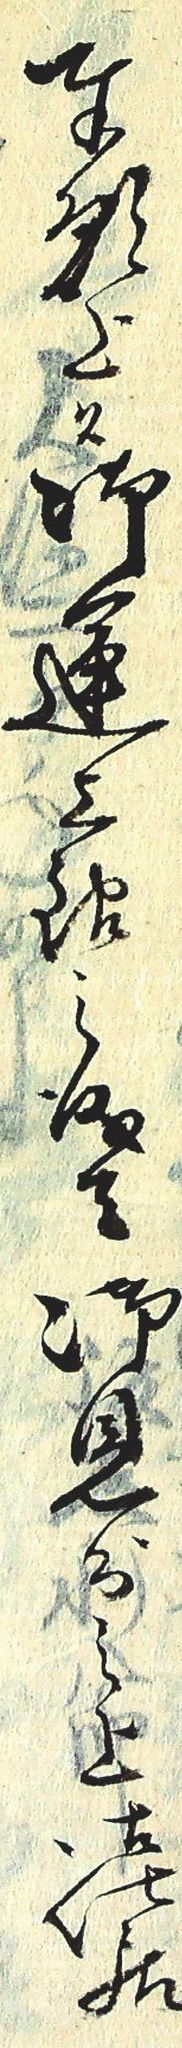奉願上候御運上銀之義は御見分之上御仕居
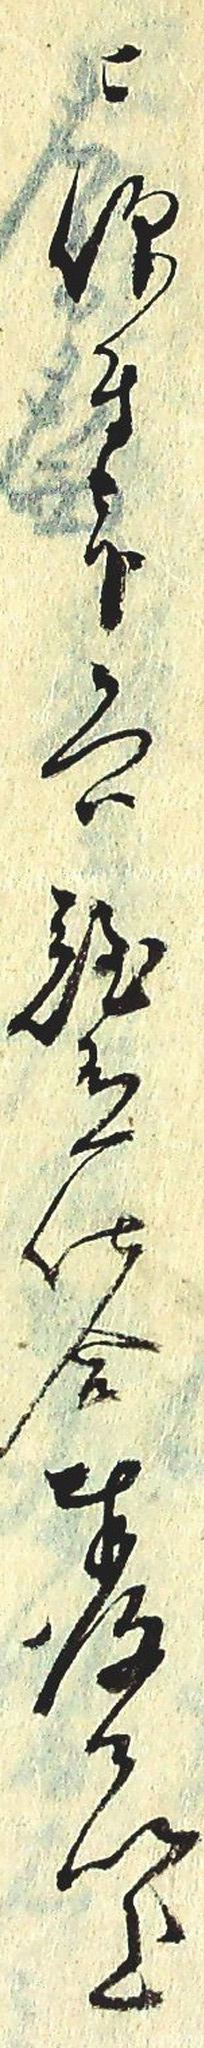被仰付被下候はゝ難有仕合奉存候以上
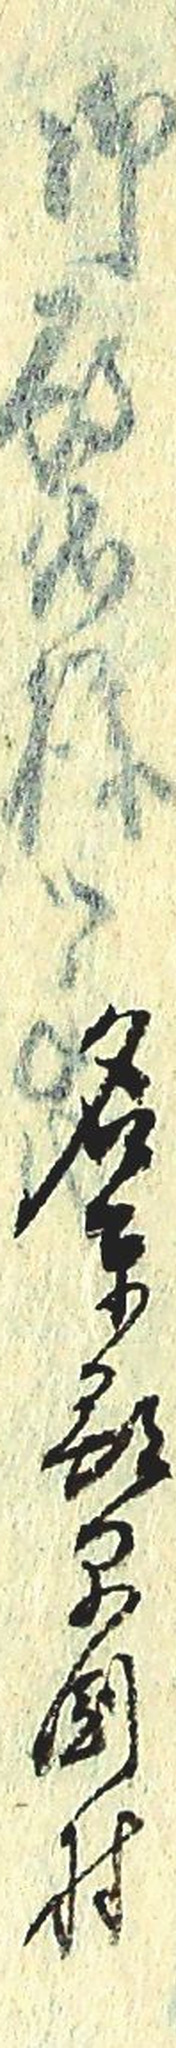名東郡早淵村
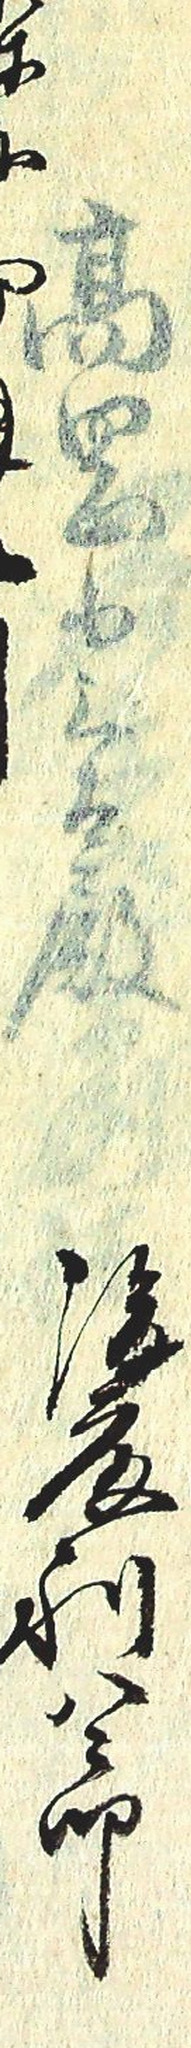後藤利八郎
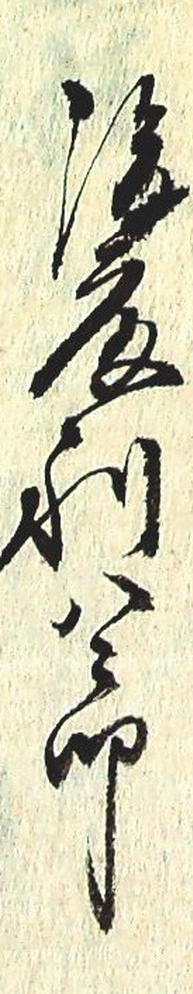後藤利八郎
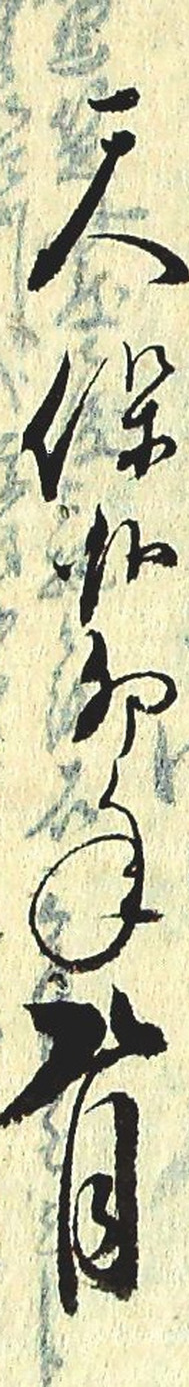天保弐卯年八月
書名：諸御願書控(弐番）
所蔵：鳴門教育大学 Naruto University of Education
